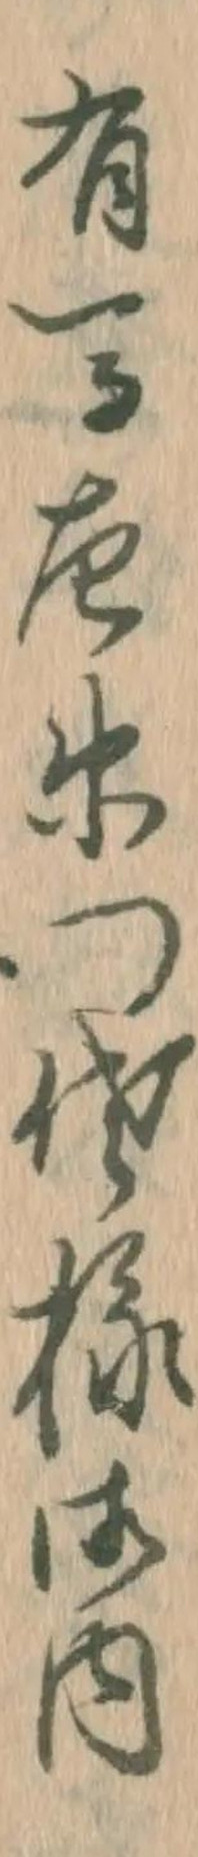有馬左衛門佐様御内
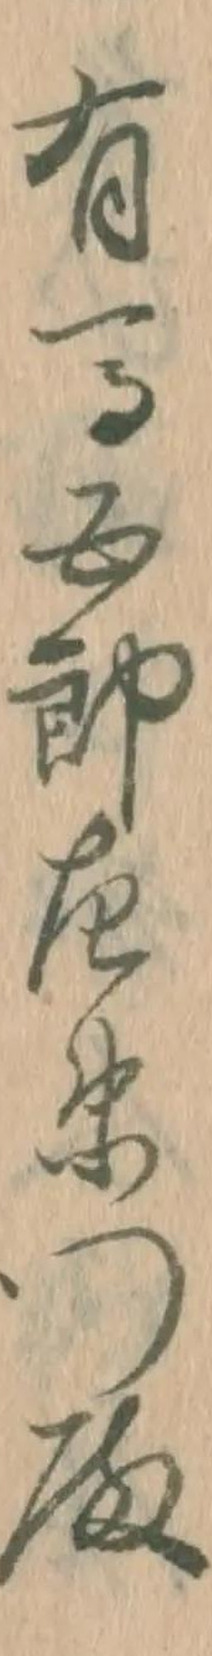有馬五郎左衛門殿
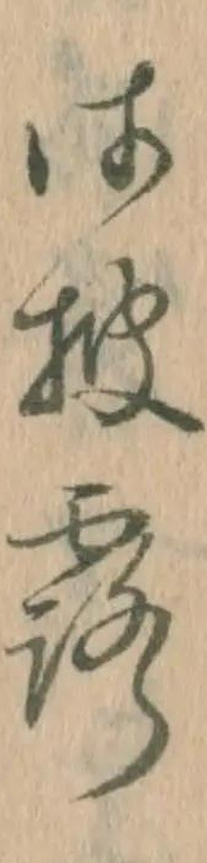御披露
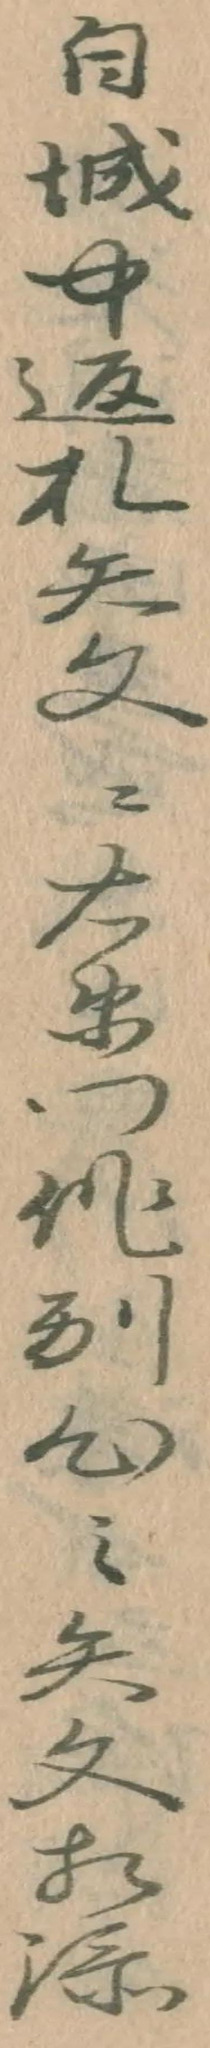自城中返札矢文に右衛門作別心之矢文相添
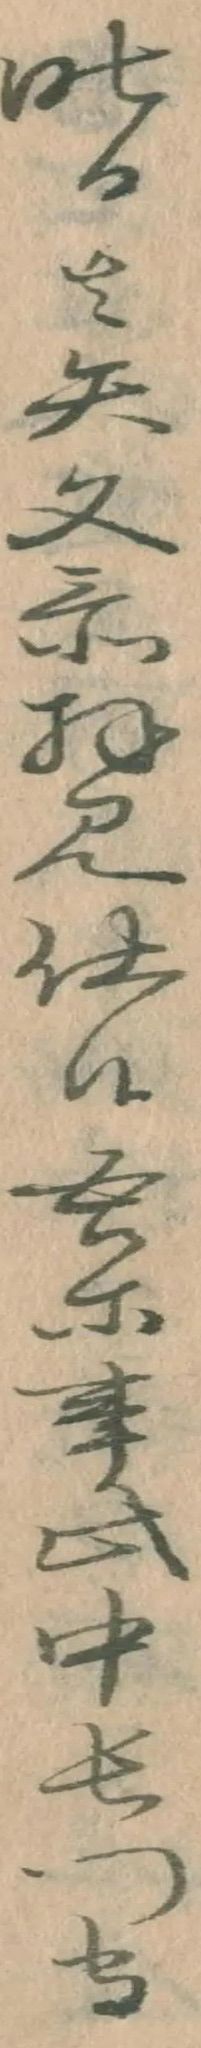昨日者矢文忝拝見仕候吾等事此中長門守
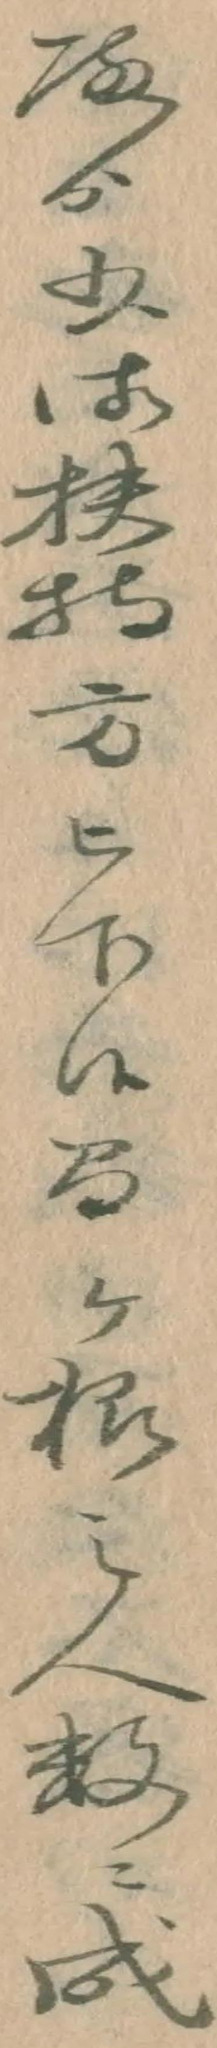殿ゟ少御扶持方被下候間け様之人数に成
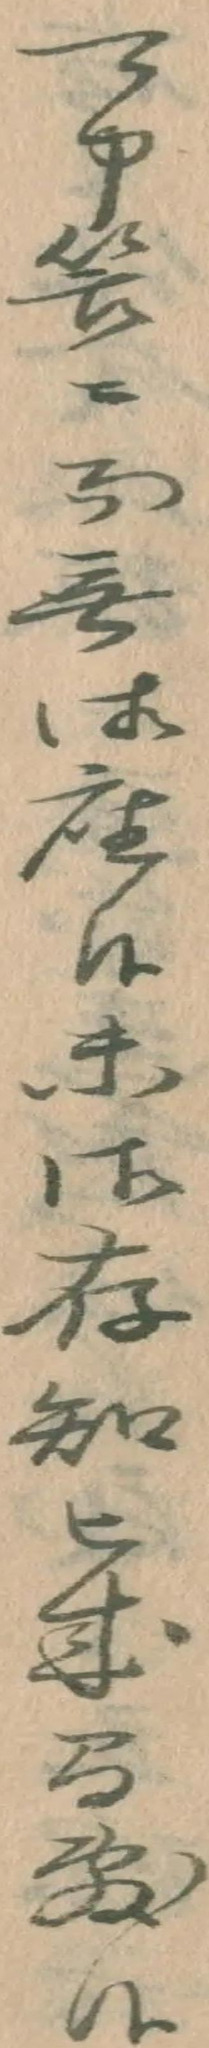可申筈に而無御座候未御存知披成間敷候
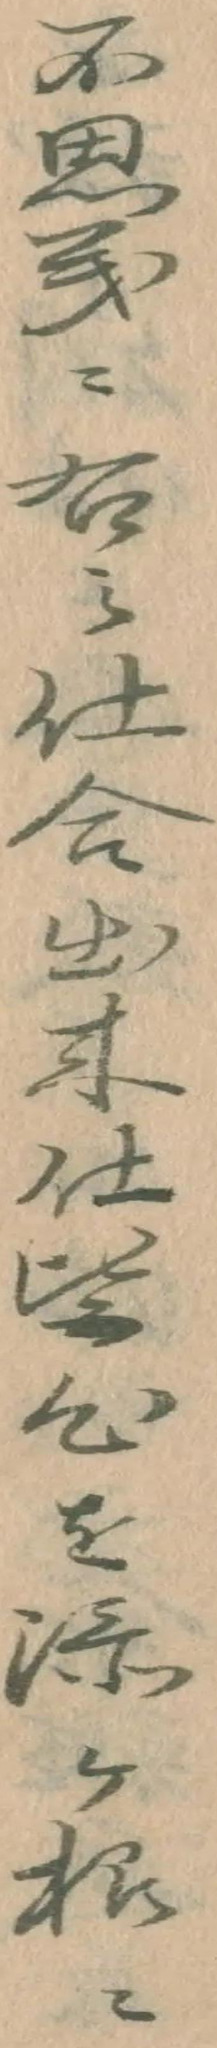不思義に右之仕合出来仕皆心を添け様に
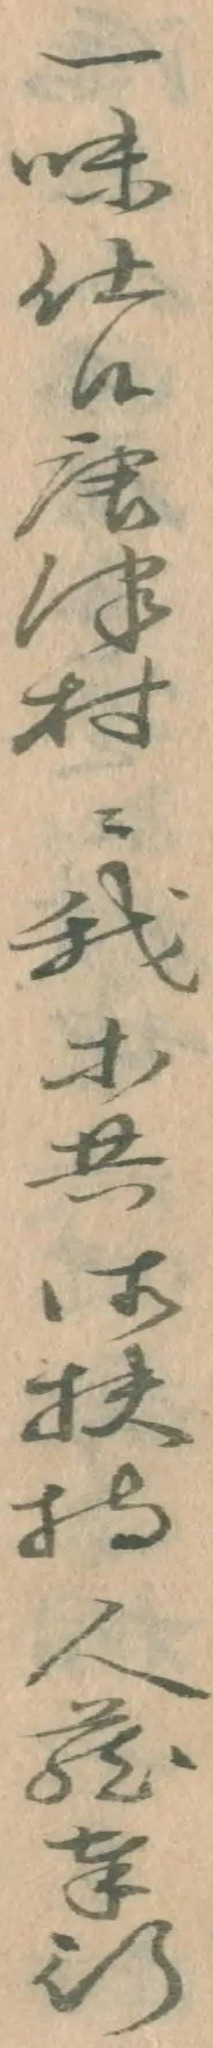一味仕候唐津村に我等共御扶持人蔵奉行

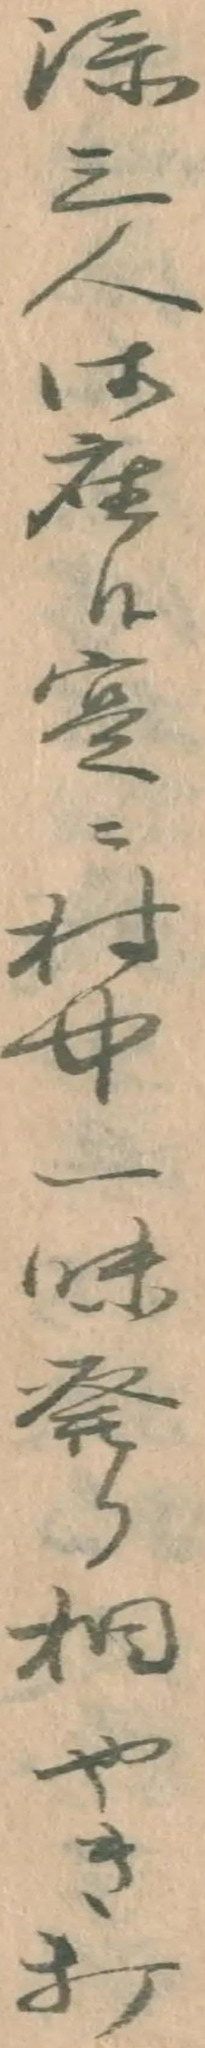添三人御座候寔に村中一味発り相やき打
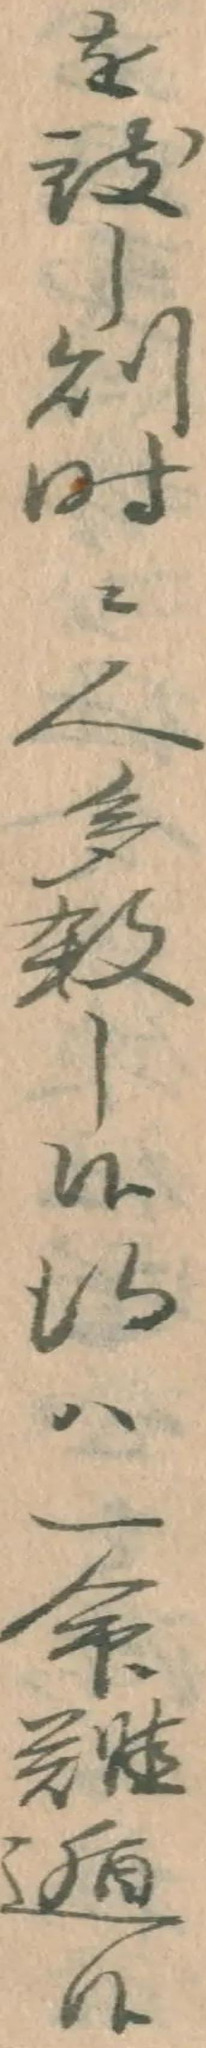を致し則時に人多殺し候得は一命難遁候
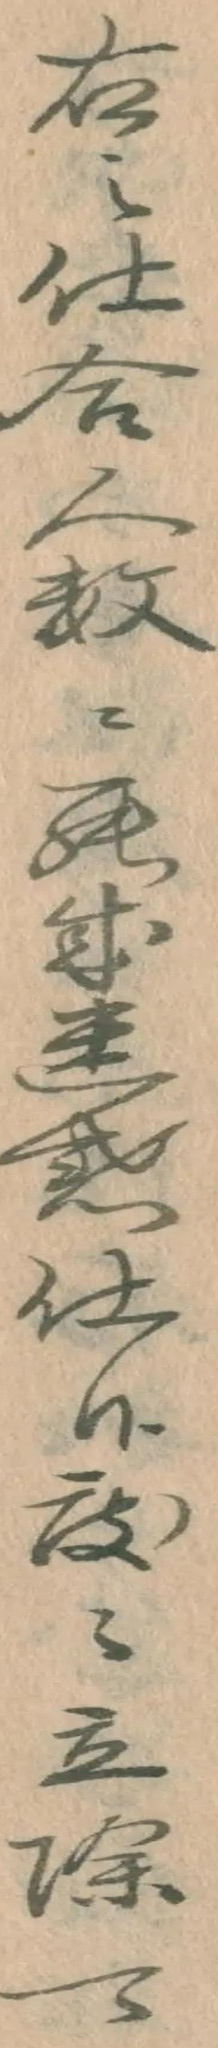右之仕合人数に罷成迷惑仕候度々立除可
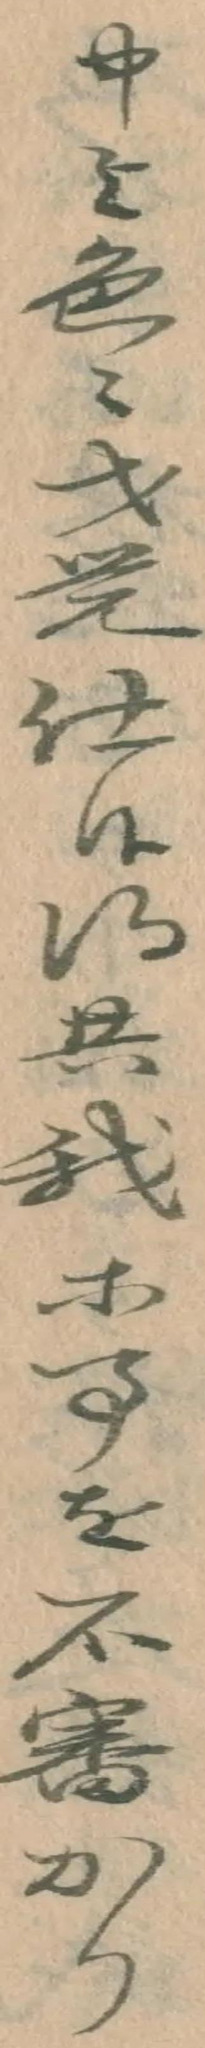申与色々才覚仕候得共我等事を不審かり
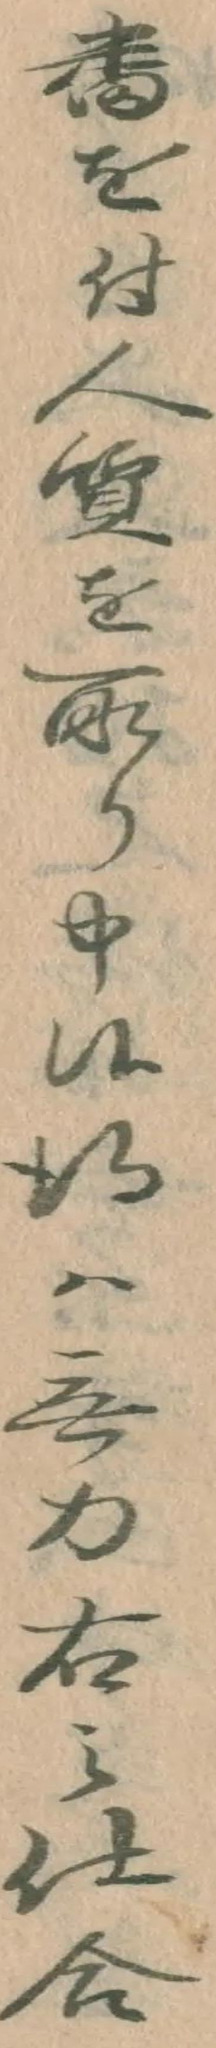番を付人質を取り申候得は無力右之仕合
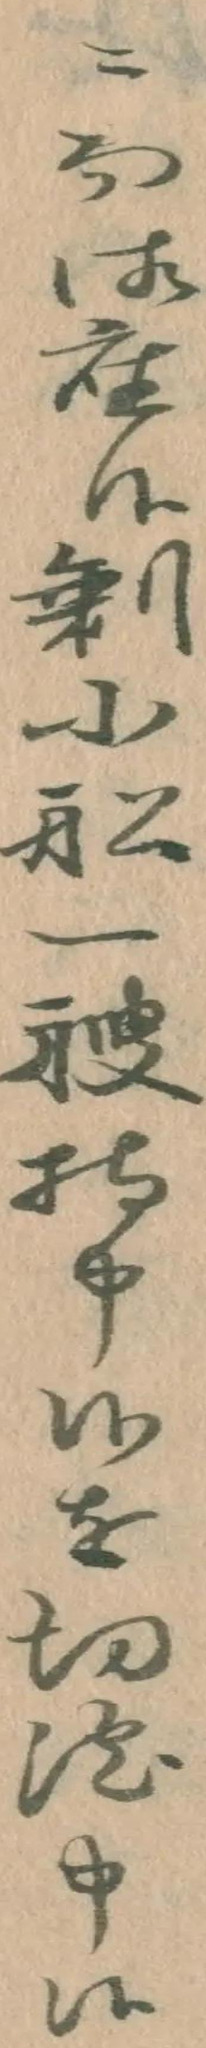に而御座候剰小舩一艘持申候を切沈申候
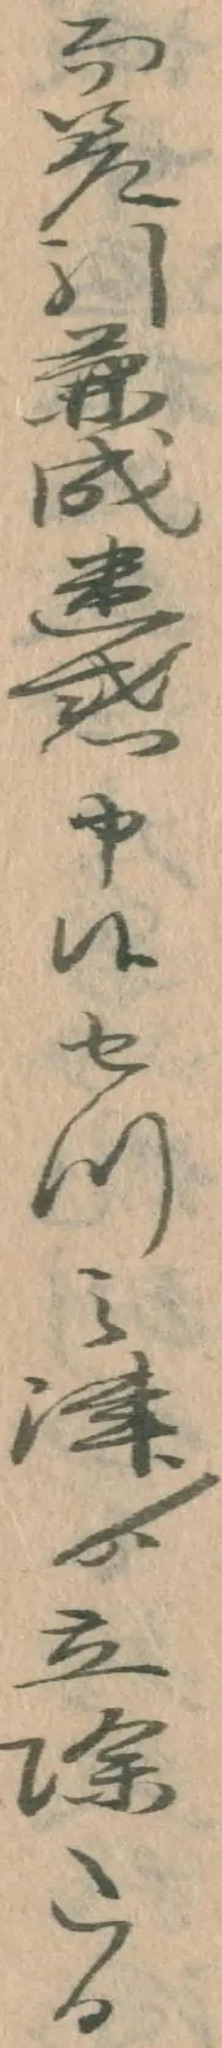而差引兼成迷惑申候せ川之津ゟ立除たる
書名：切支丹御退治記 49巻. [6]
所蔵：国立国会図書館 National Diet Library, JAPAN
